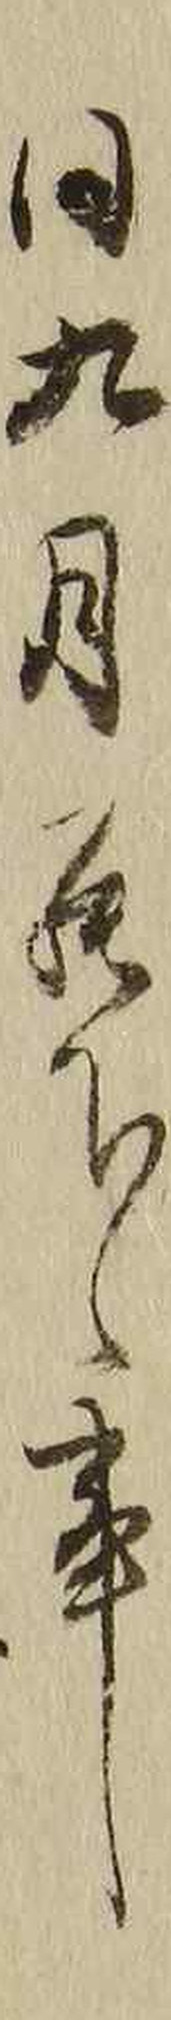同九月罷下候事
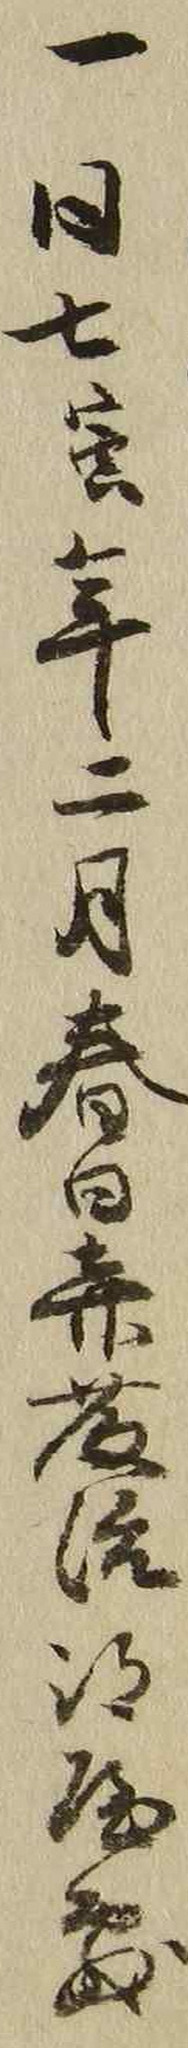一同七寅年二月春日喜藤治跡屋敷
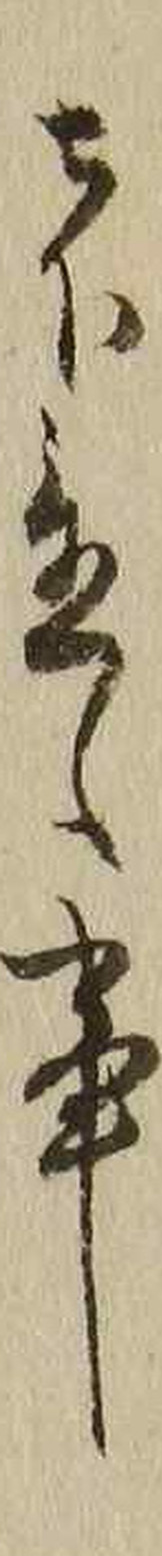被下置候事
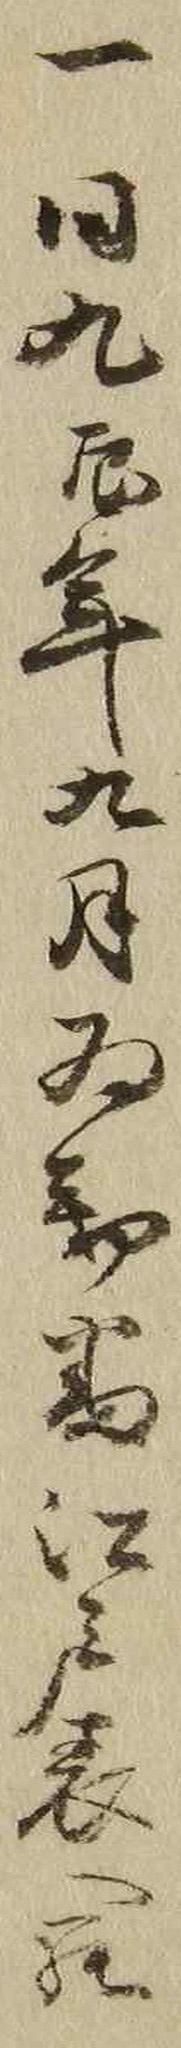一同九辰年九月為勤番江戸表へ罷
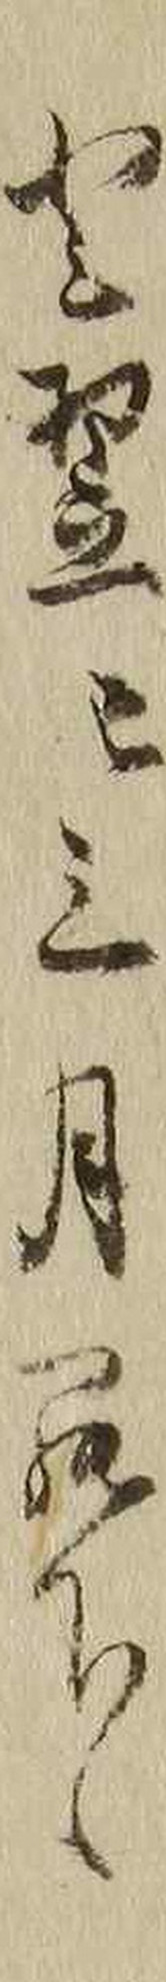登翌巳三月罷下候
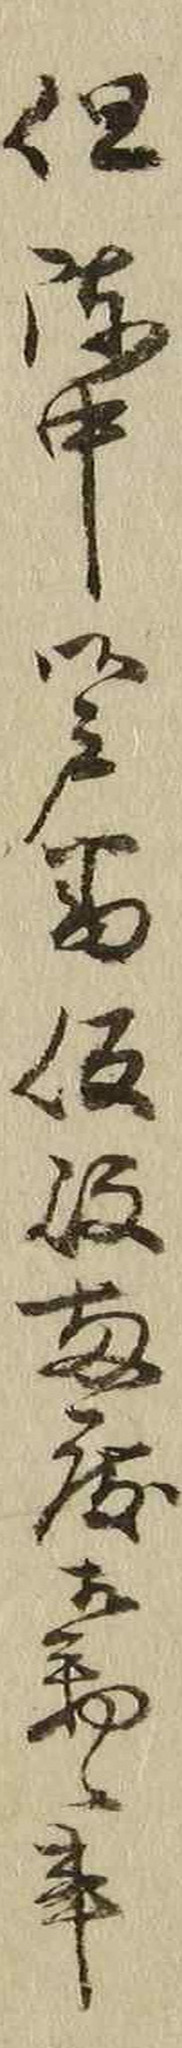但陣中御戸番仮役両度相勤候事
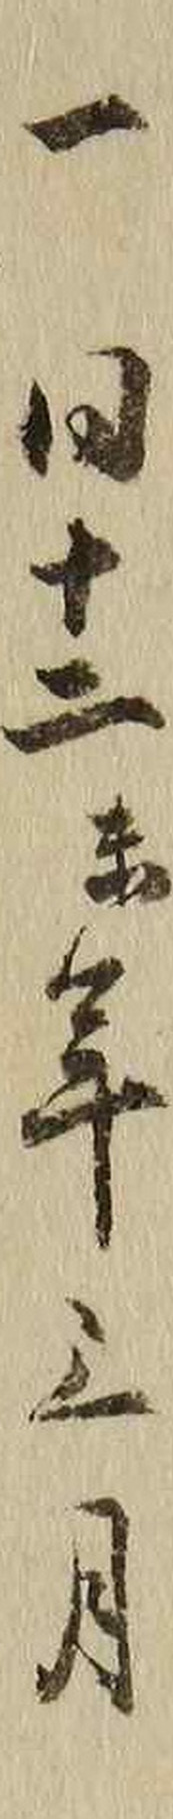一同十二未年三月
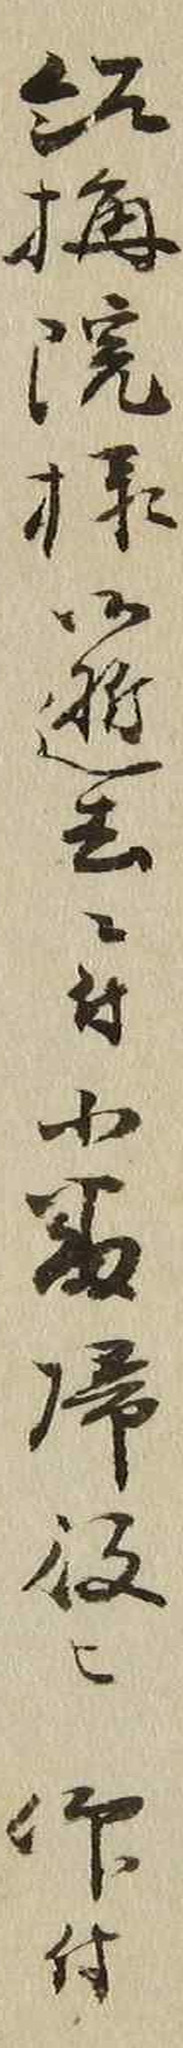紹栴院様御逝去ニ付小番帰役被仰付
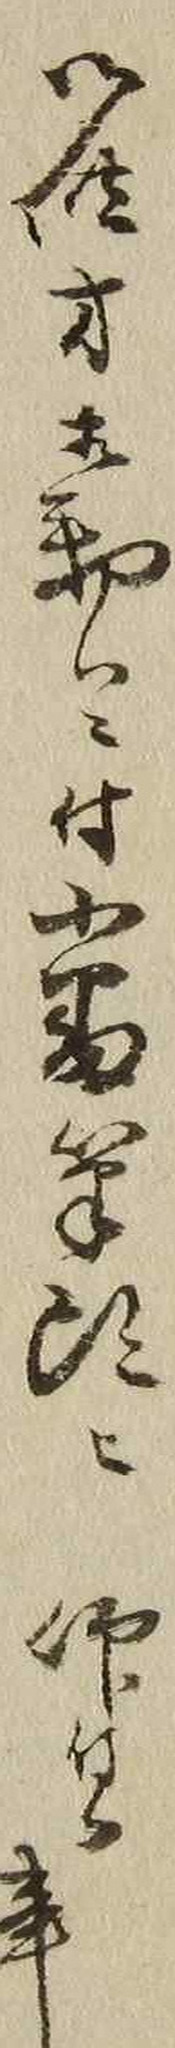御供方相勤候ニ付小番筆頭被仰付候事
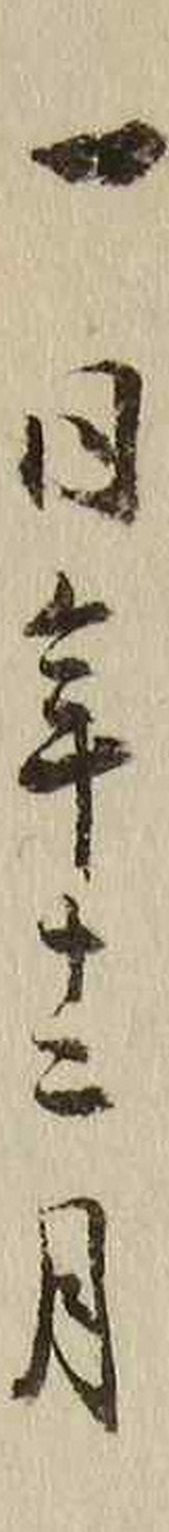一同年十二月
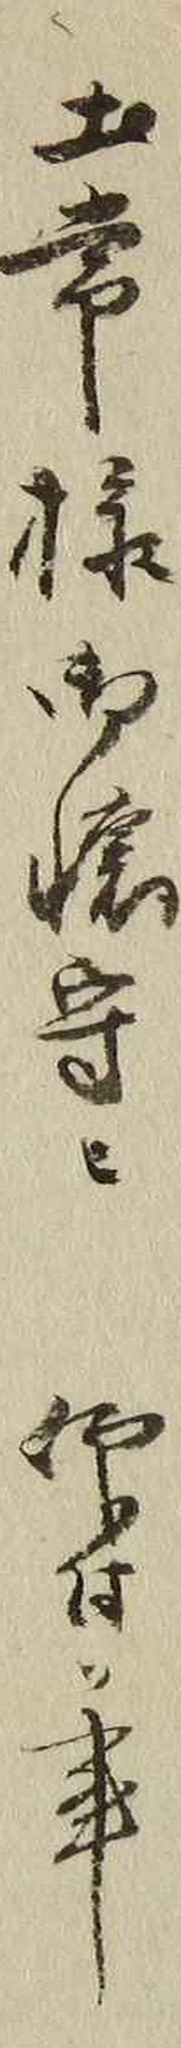土常様御懐守被仰付候事
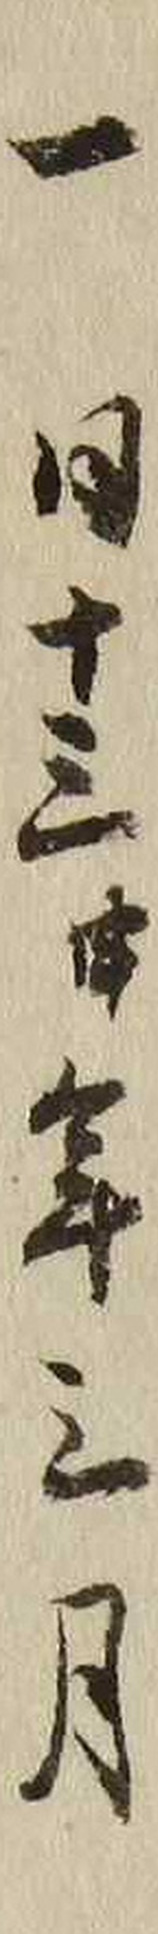一同十三申年三月
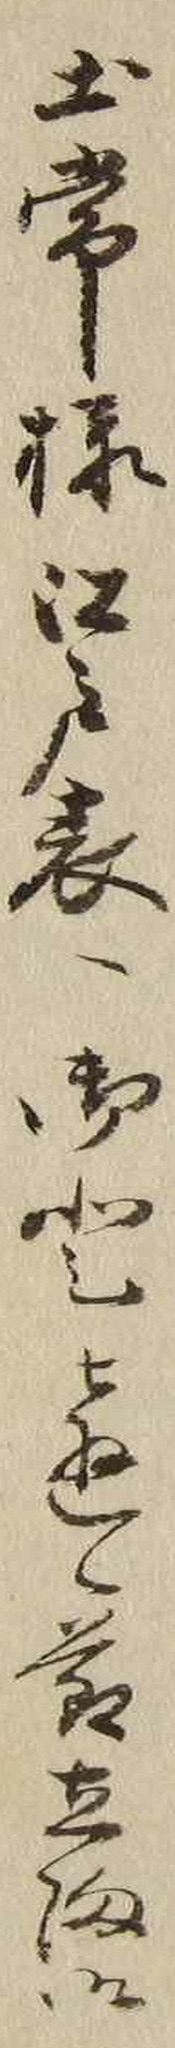土常様江戸表へ御登被遊候節立帰御
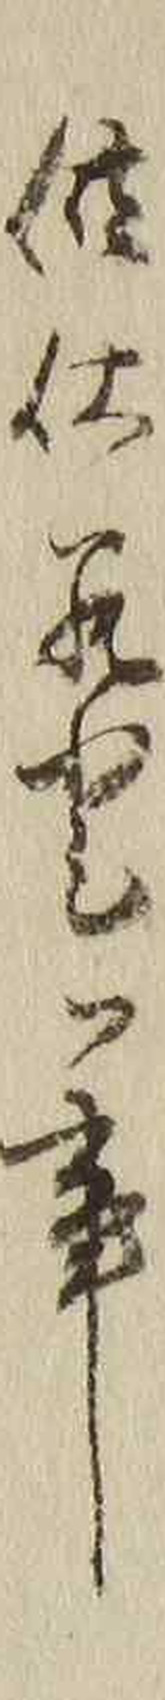供仕罷登候事
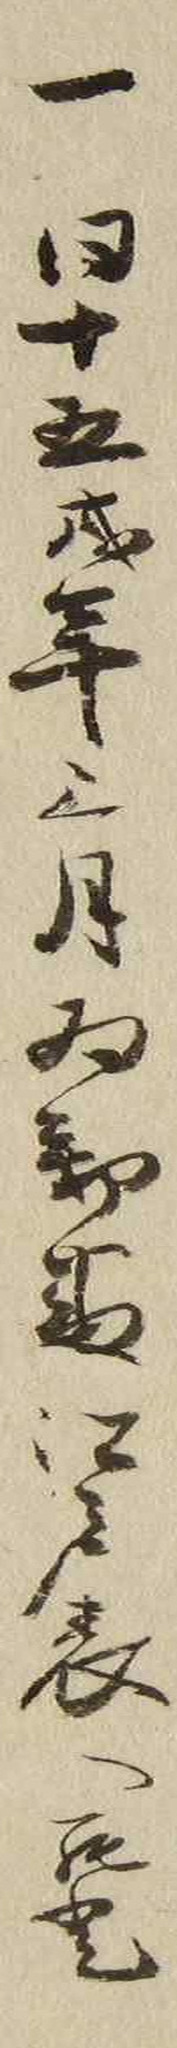一同十五戌年三月為勤番江戸表へ罷登
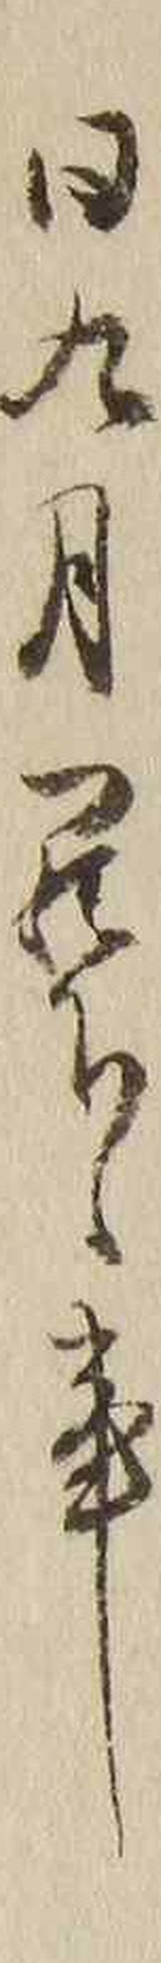同九月罷下候事
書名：諸士系譜　巻之232　け之部1
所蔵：会津若松市立会津図書館
